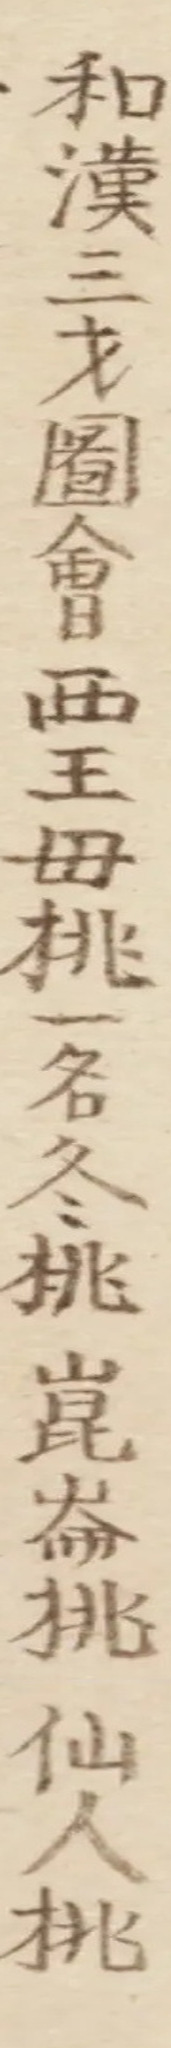和漢三才図会西王母桃一各冬桃崑崙桃仙人桃
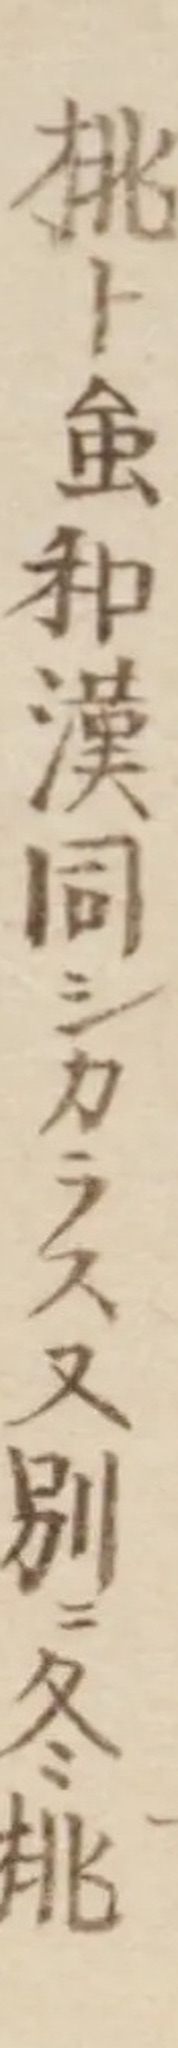桃ト雖和漢同シカラス又別ニ冬桃
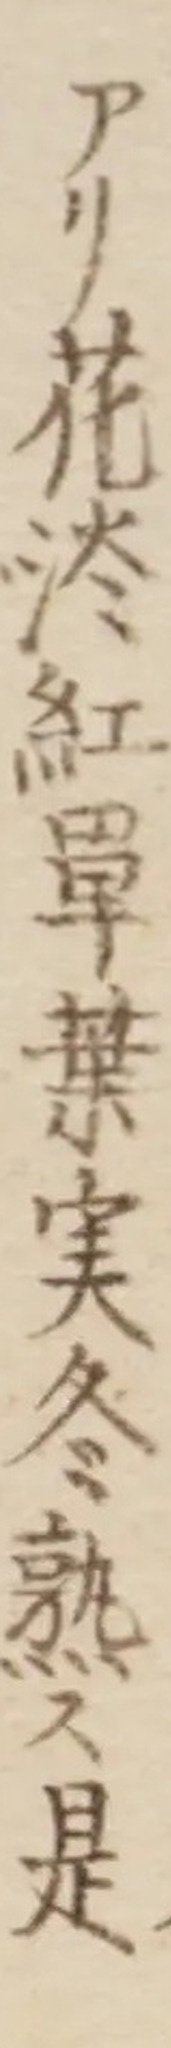アリ花淡紅単葉実冬熟ス是
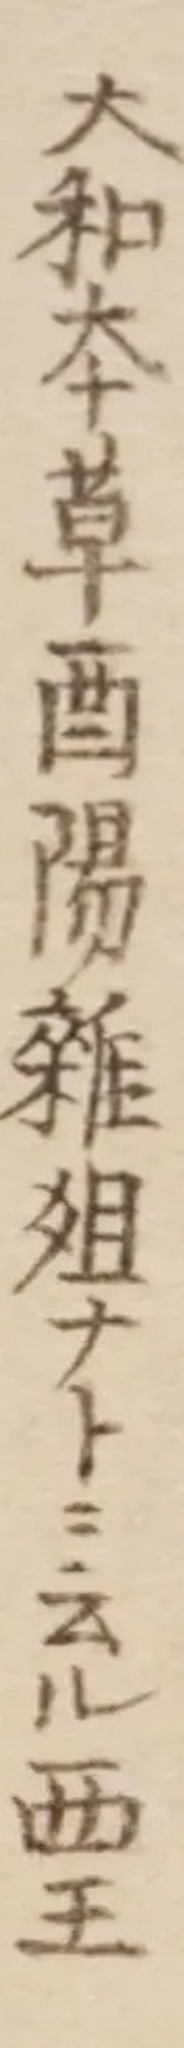大和本草酉陽雑俎ナトニ云ル西王
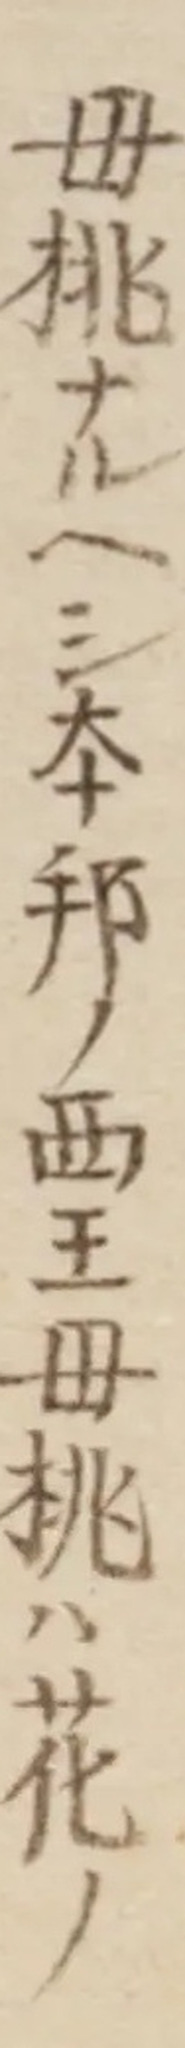母桃ナルへシ本邦ノ西王桃ハ花ノ
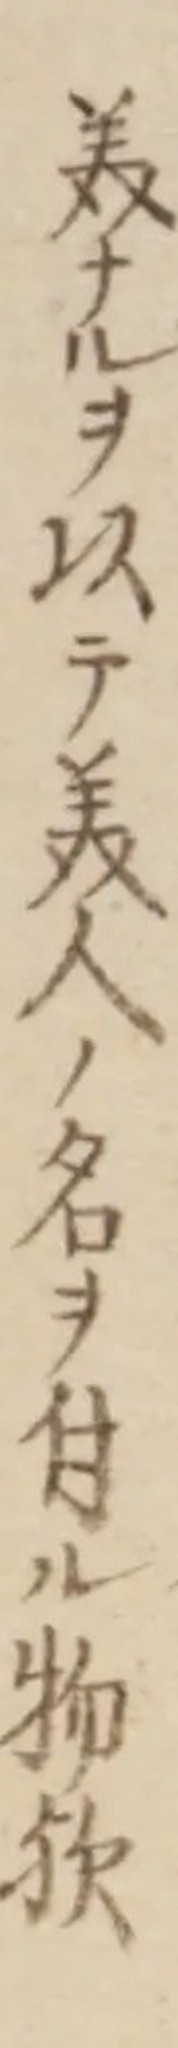美ナルヲ以テ美人ノ名ヲ付ル物欤
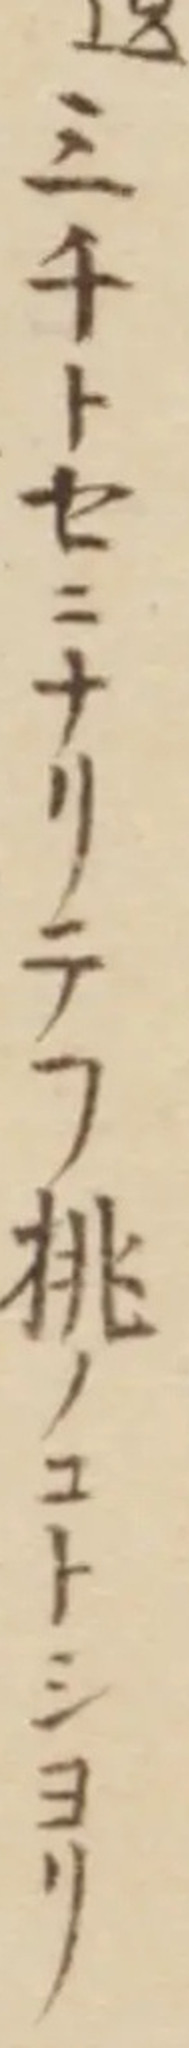三チトセニナリテフ桃ノコトシヨリ
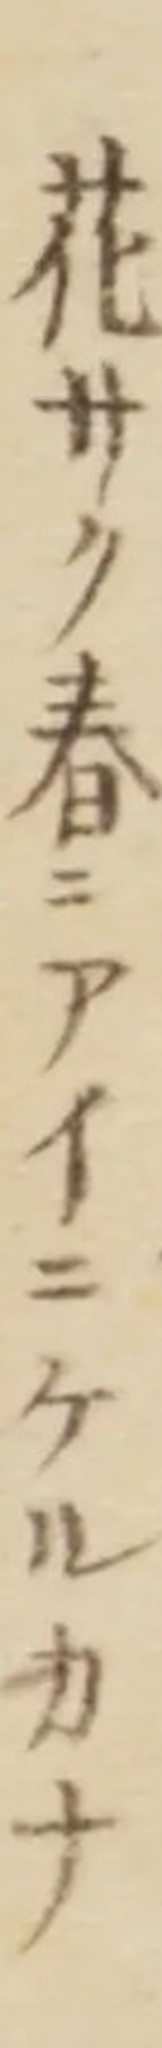花サク春ニアイニケルカナ

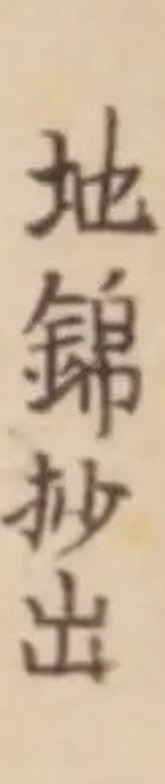地錦抄出
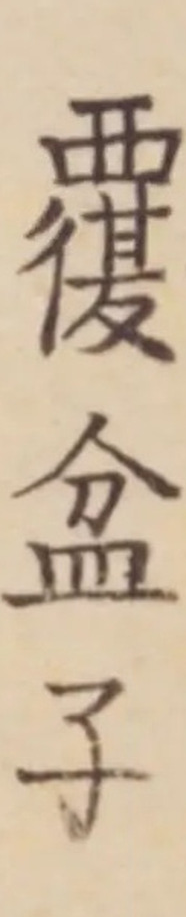覆盆子
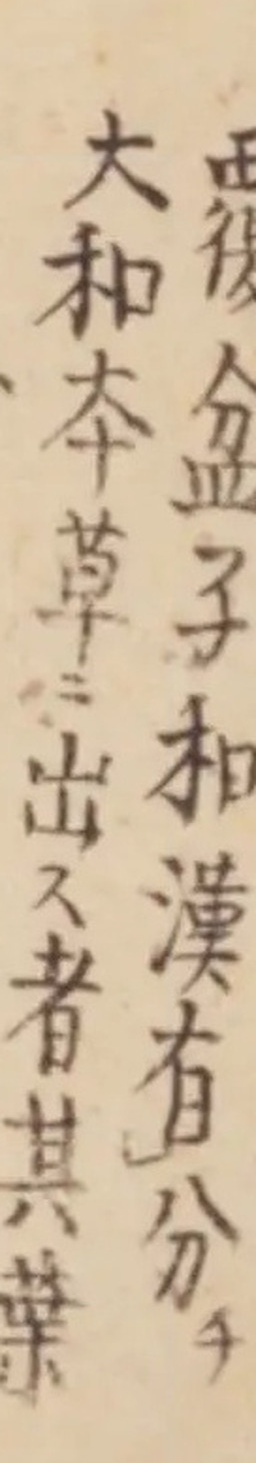大和本草ニ出ス者其葉
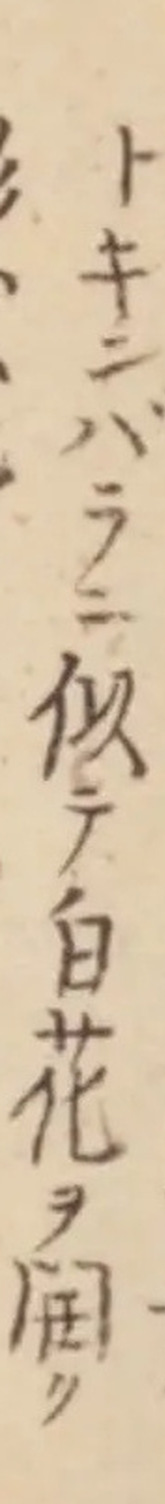トキンバラン似テ白花ヲ開ク
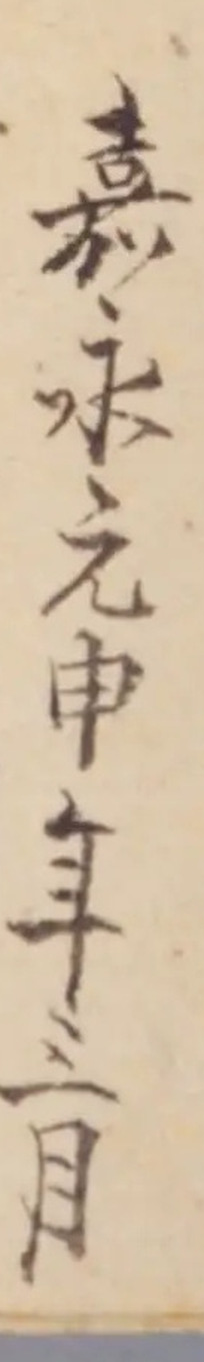嘉永元申年三月
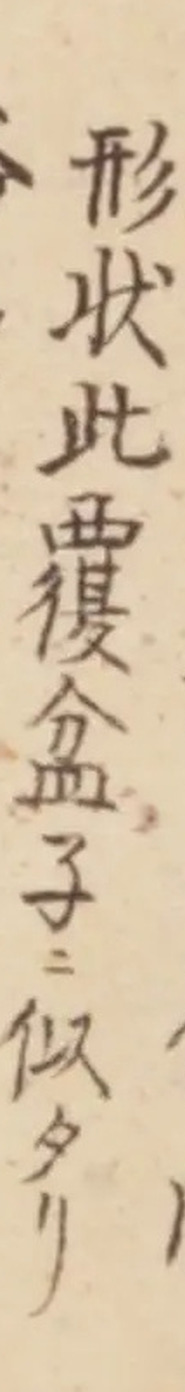形状此覆盆子ニ似タリ
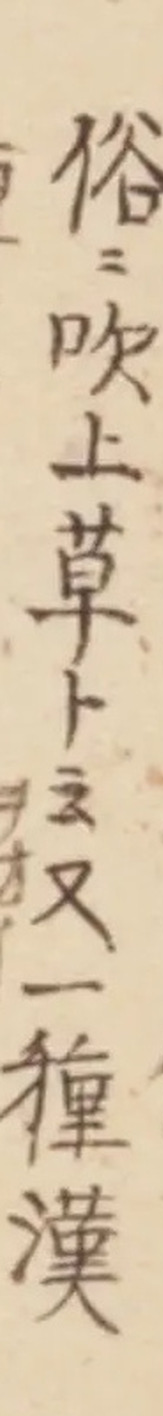俗ニ吹上草ト云又一種漢
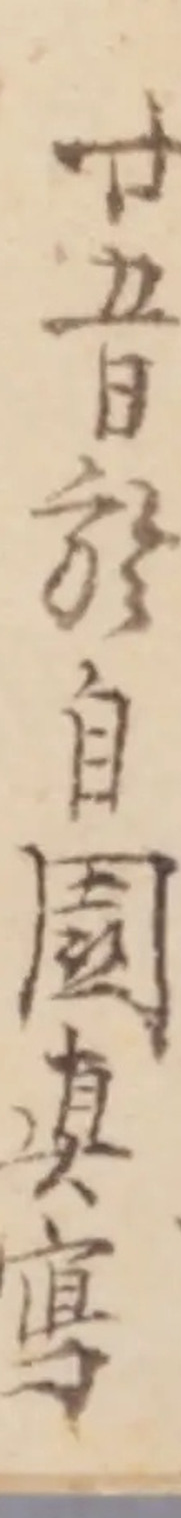廿五日自園真写
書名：梅園草木花譜冬之部
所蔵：国立国会図書館 National Diet Library, JAPAN
